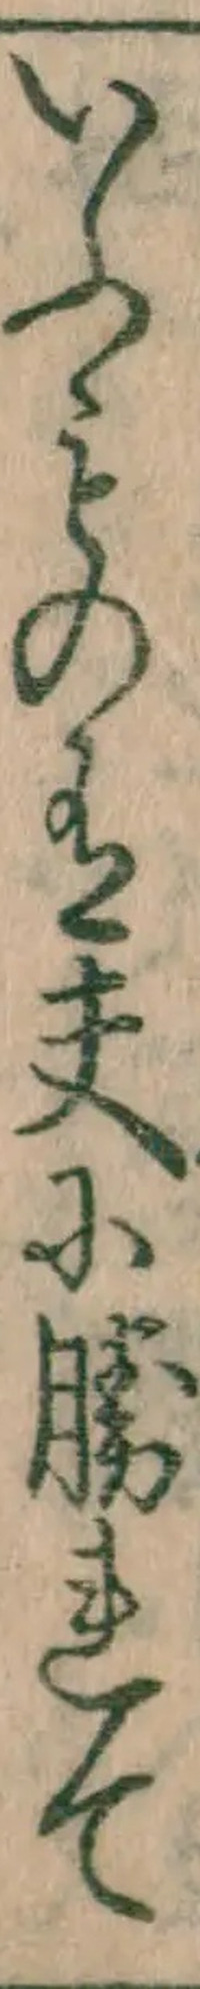いふもの有夫に勝れて
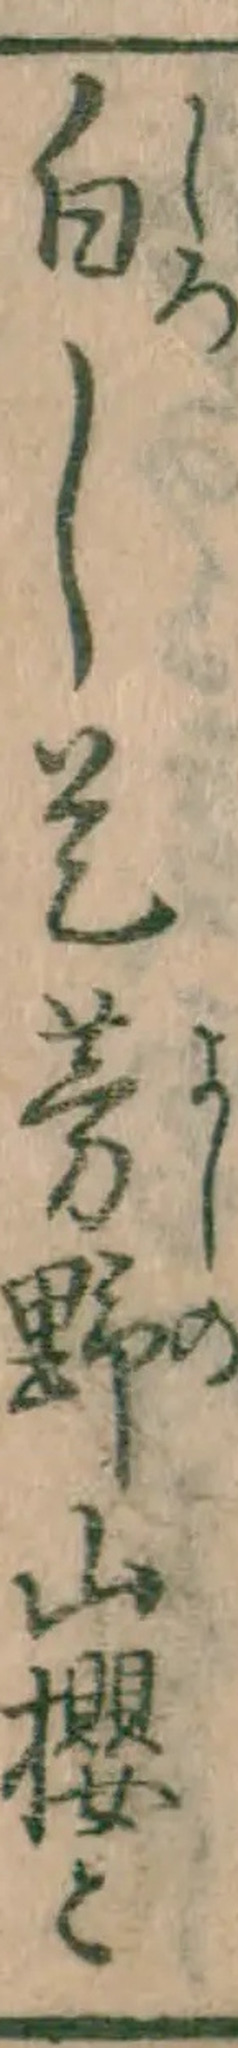白し是芳野山桜と
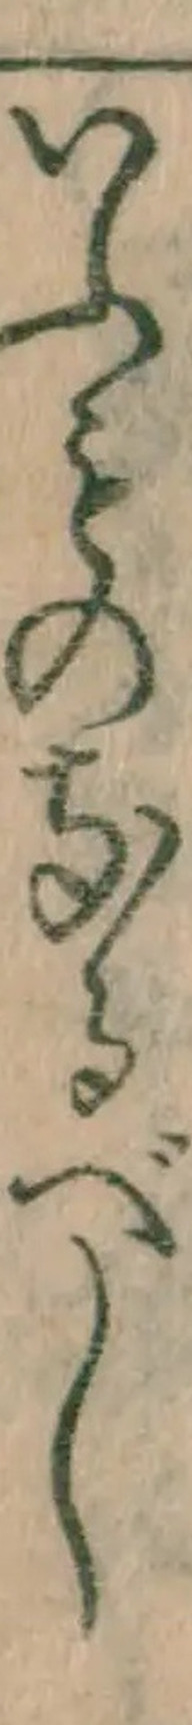いふものなるべし

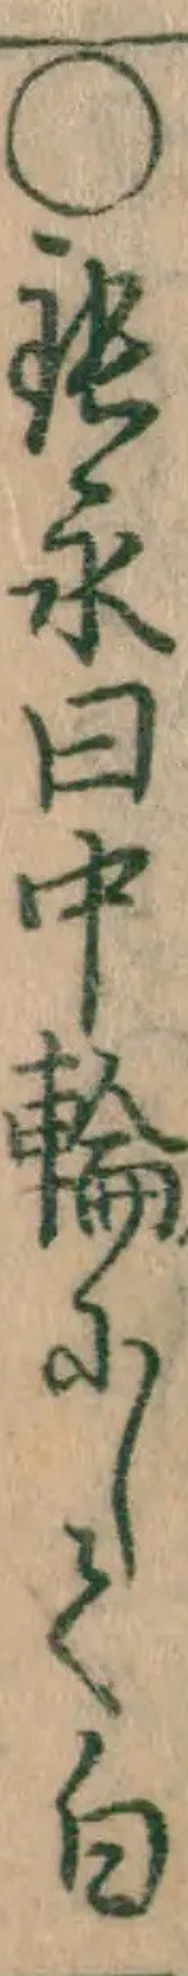○鈍永曰中輪にして白
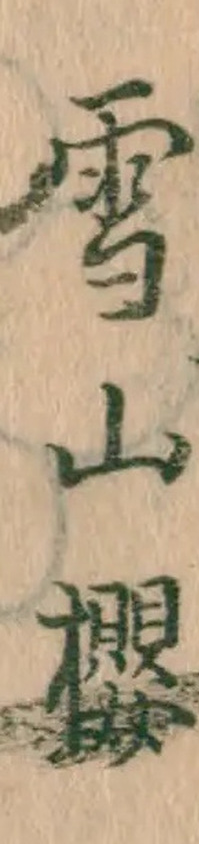雪山桜
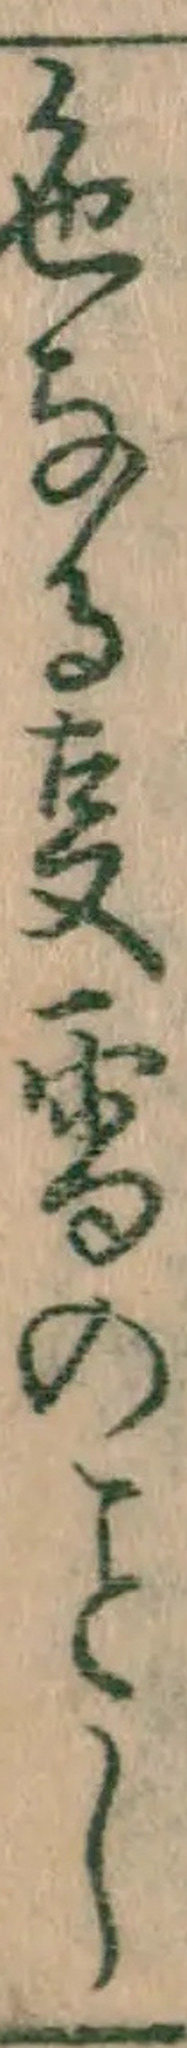色なる事雪のことし
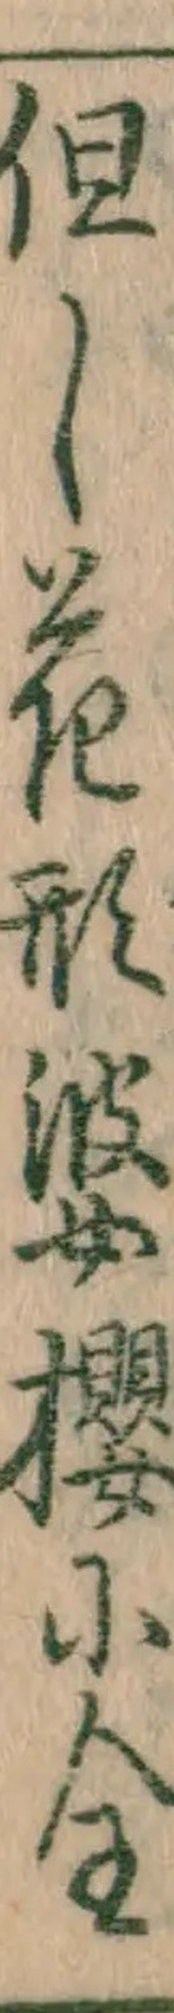但し花形婆桜に全
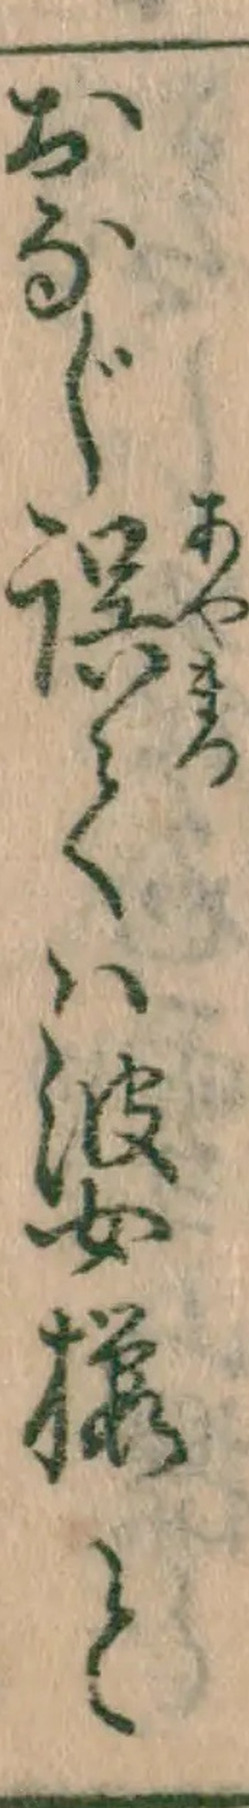おなじ誤ては婆桜と
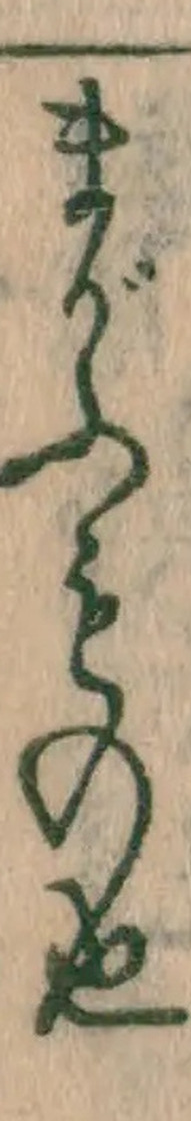まがふもの也
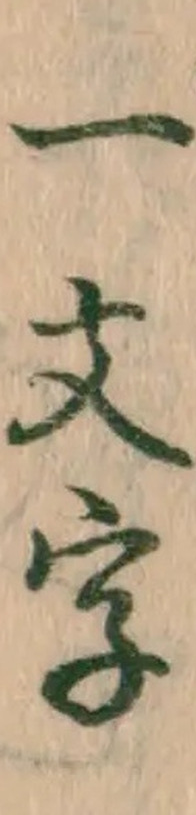一文字
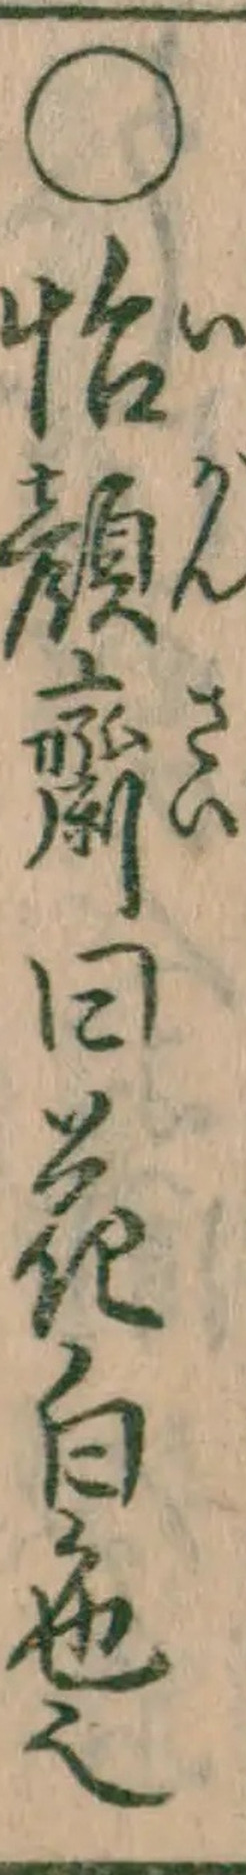○怡顔斎曰花白色也
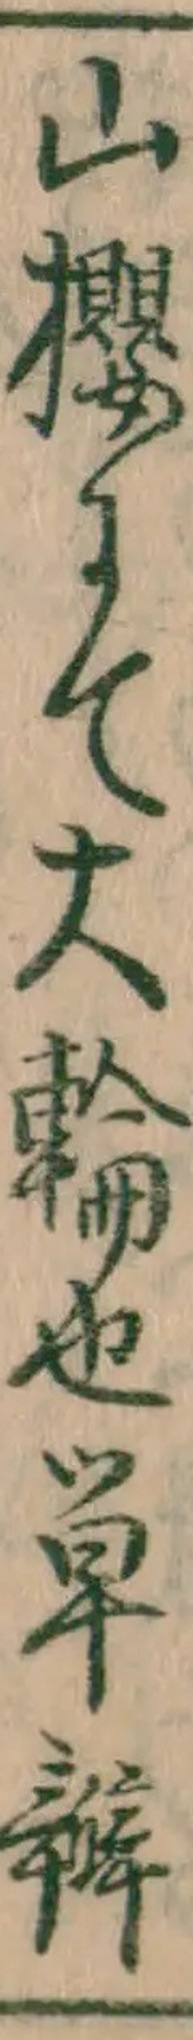山桜にて大輪也単弁
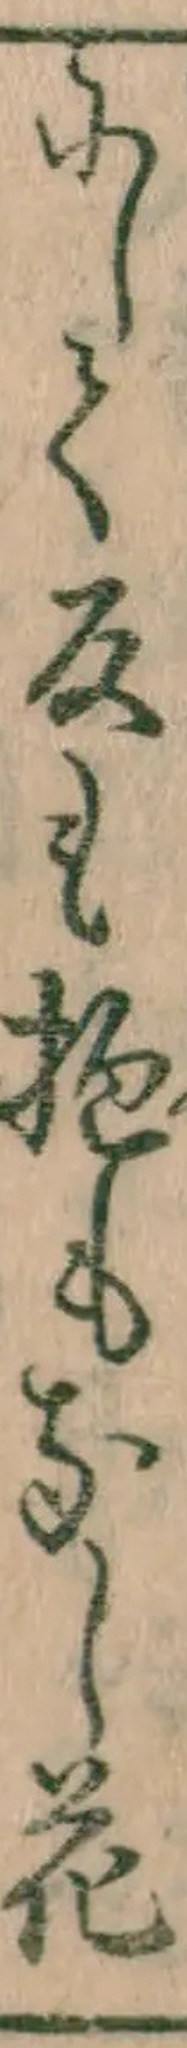にして反も抱もなし花
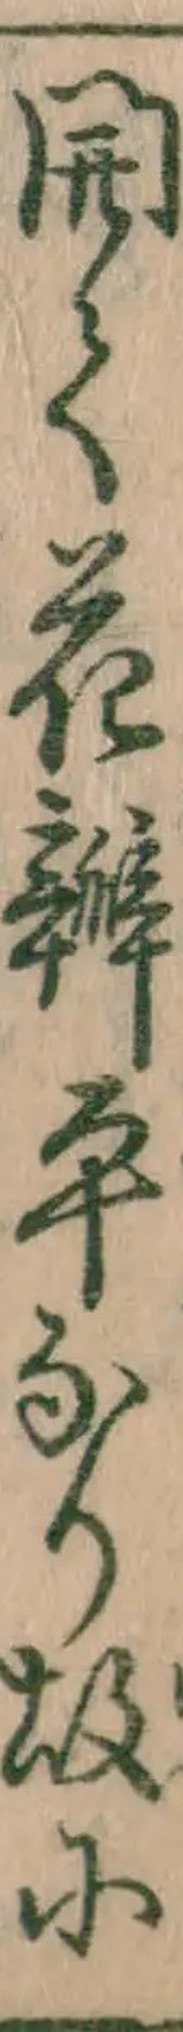開て花弁平なり故に
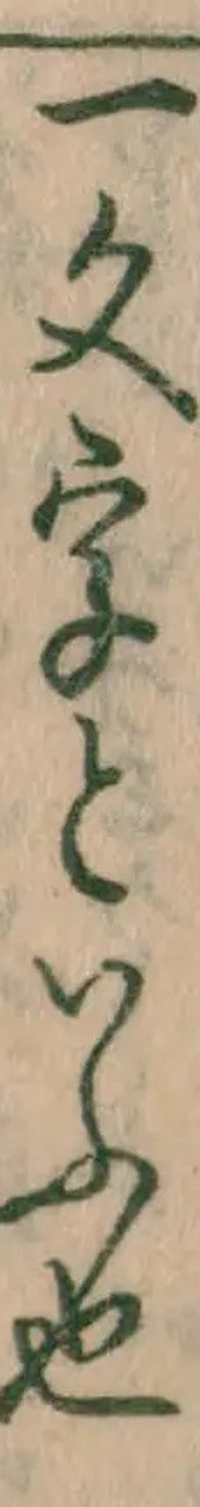一文字といふ也

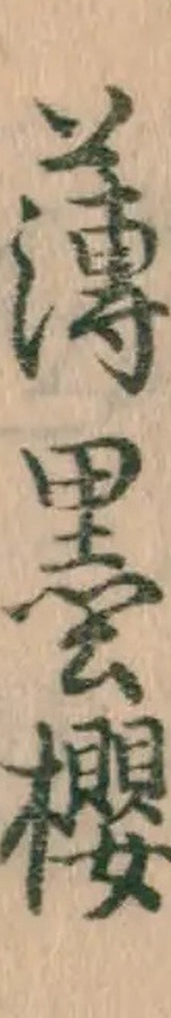薄墨桜
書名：怡顔齋櫻品
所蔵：国立国会図書館 National Diet Library, JAPAN
